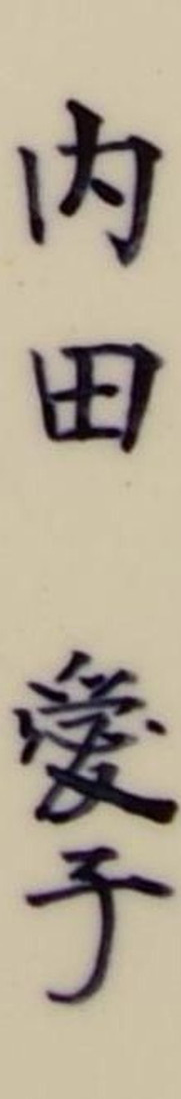内田愛子
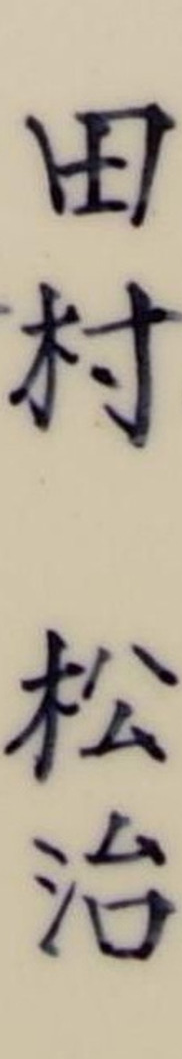田村松治
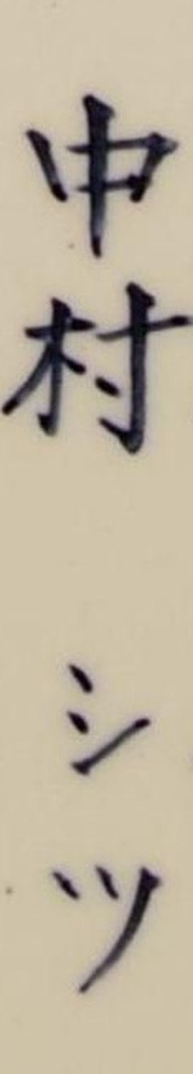中村シツ
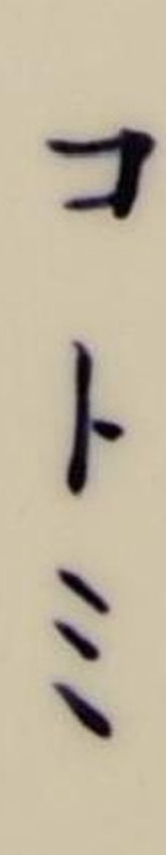コトミ
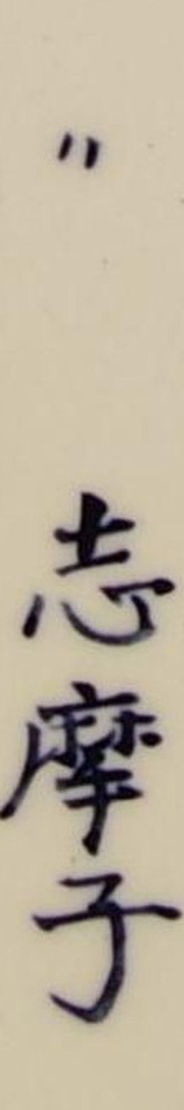志摩子
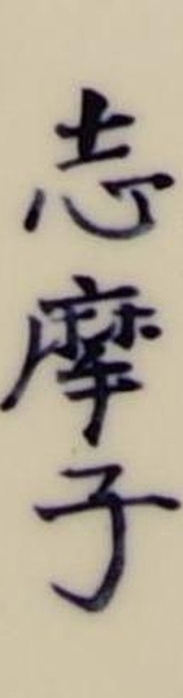志摩子
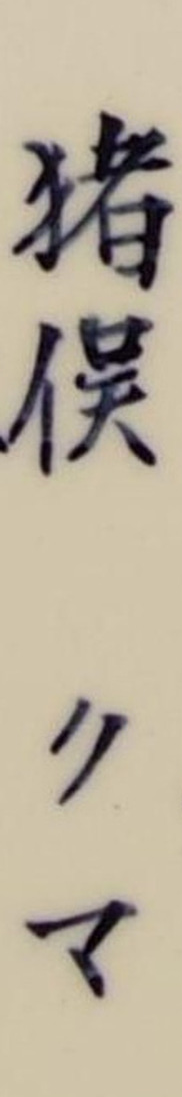猪侯クマ
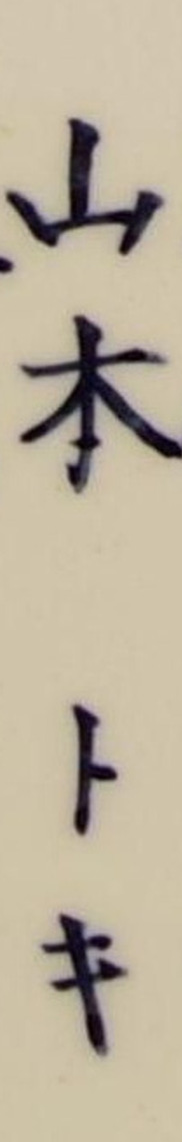山本トキ
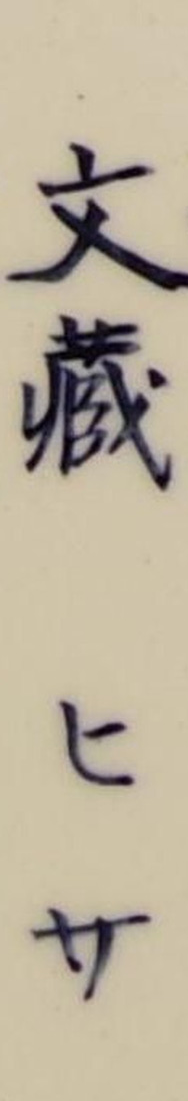文蔵ヒサ
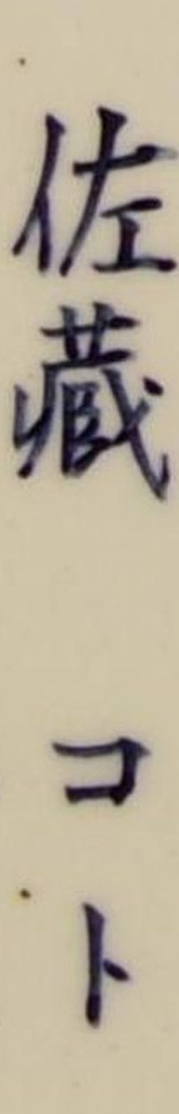佐蔵コト
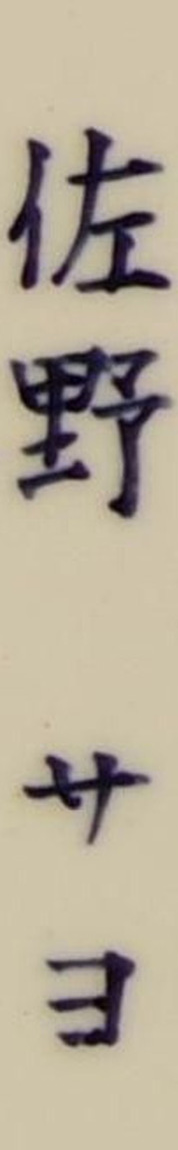佐野サヨ
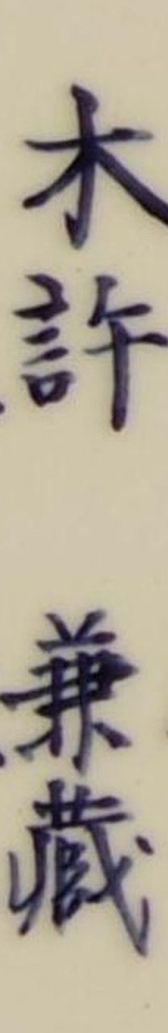木許兼蔵
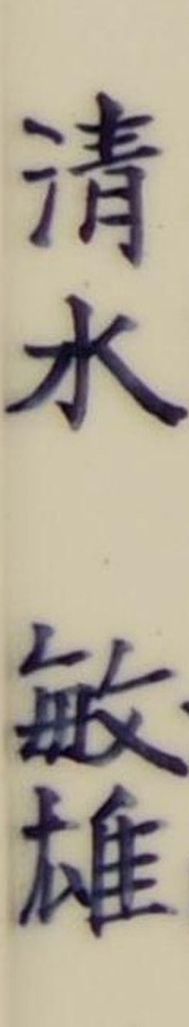清水敏雄

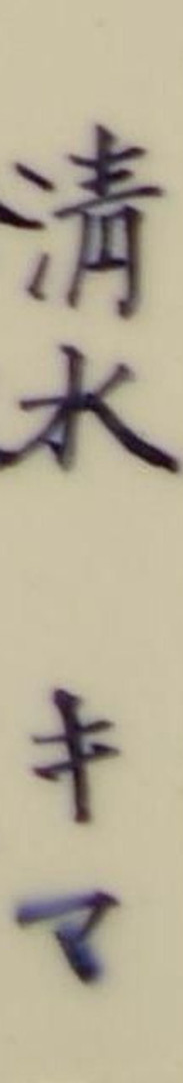清水キマ
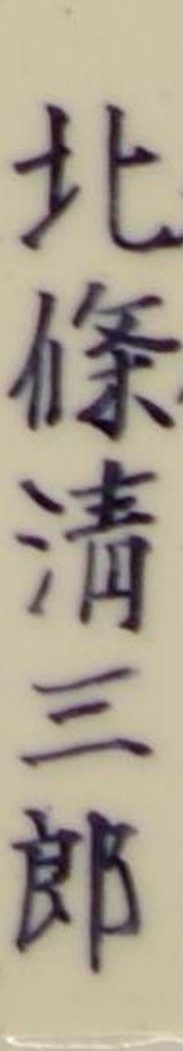北條清三郎
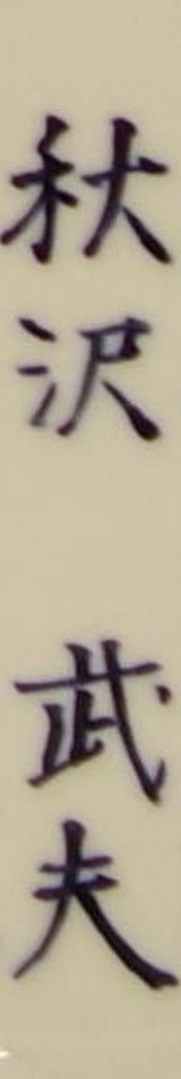秋沢武夫
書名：E~L
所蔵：高野山金剛峯寺
